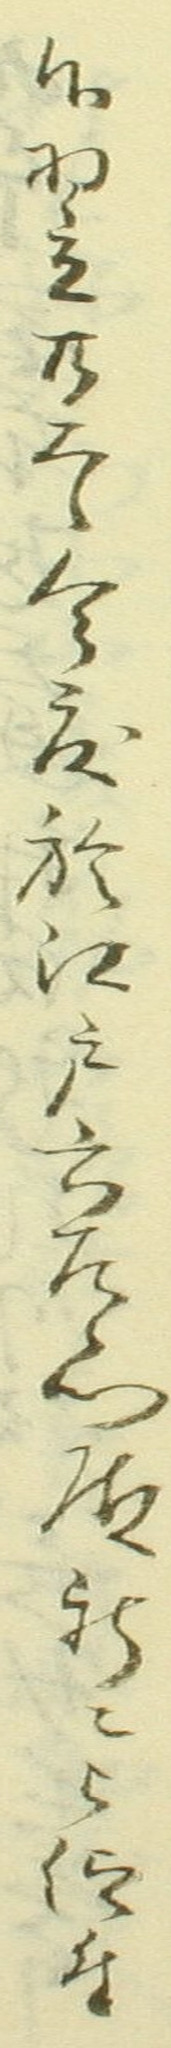候翌廿二日今度於江戸六左衛門殿新に被仰付
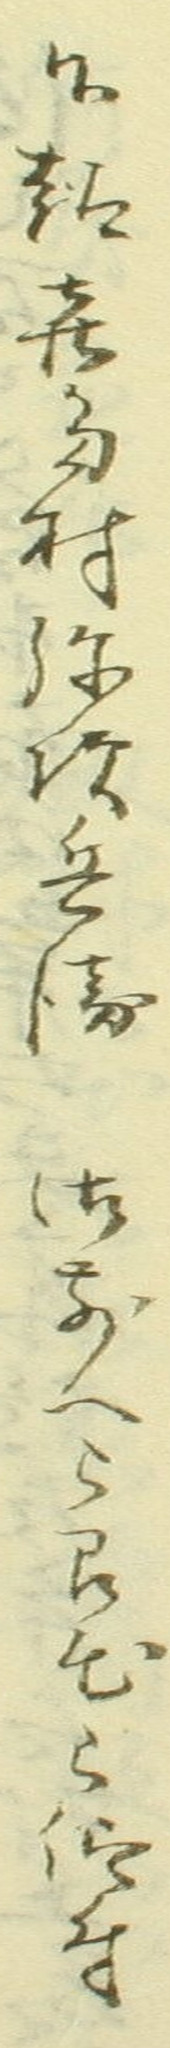候趣喜多村弥次兵衛ごぜん御前へ被召出被仰付
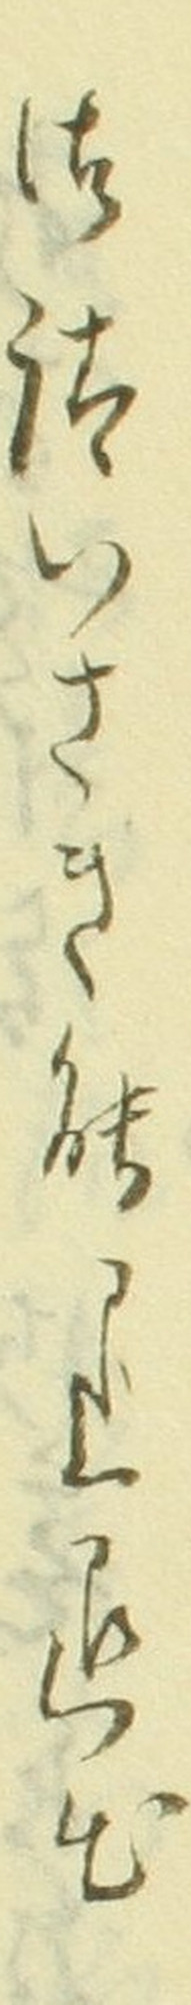御詰いさき能申上退出
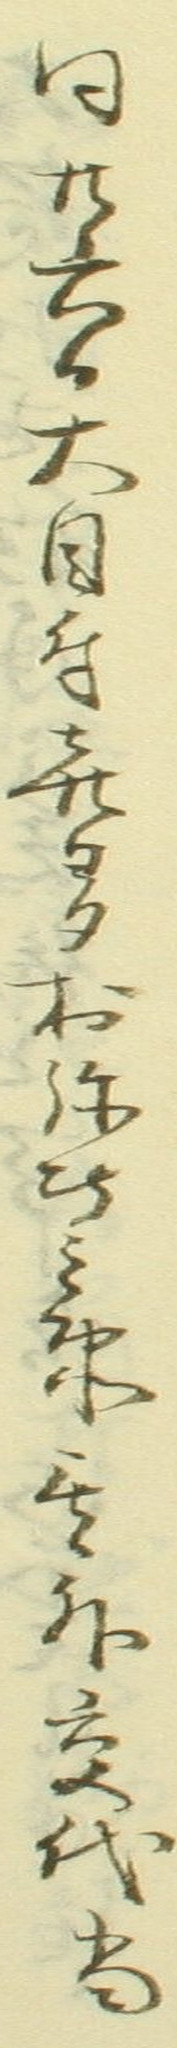一同廿六日大目付喜多村弥次兵衛其外交代当
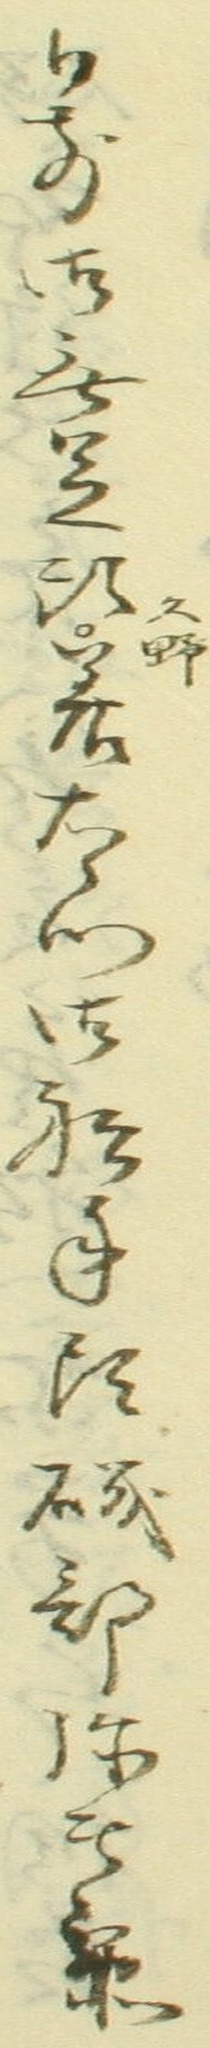日前御無足頭久野着右衛門御船手頭磯部弥兵衛
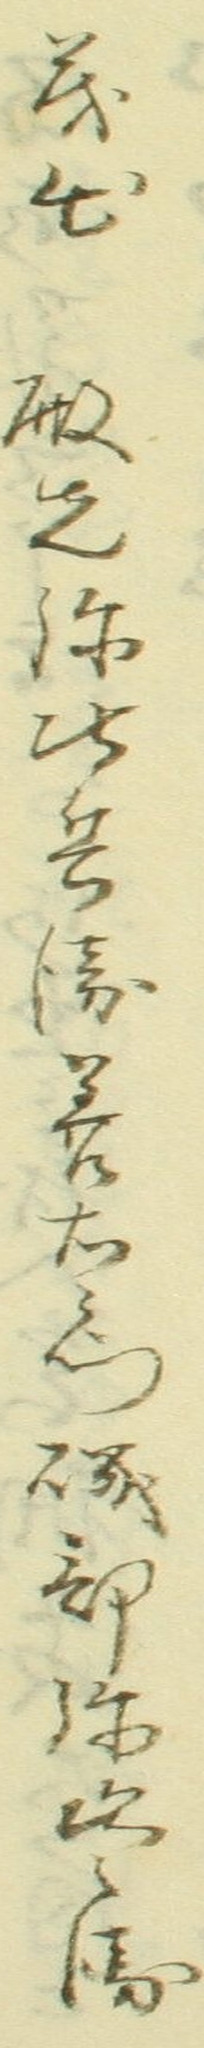茂七殿先弥次兵衛善右衛門磯部弥次兵衛
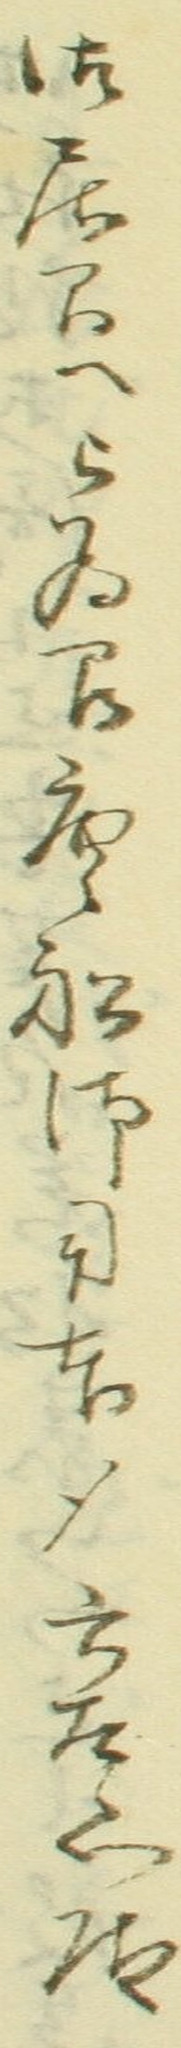御居間へ被為間？候船御用者〆六左衛門殿
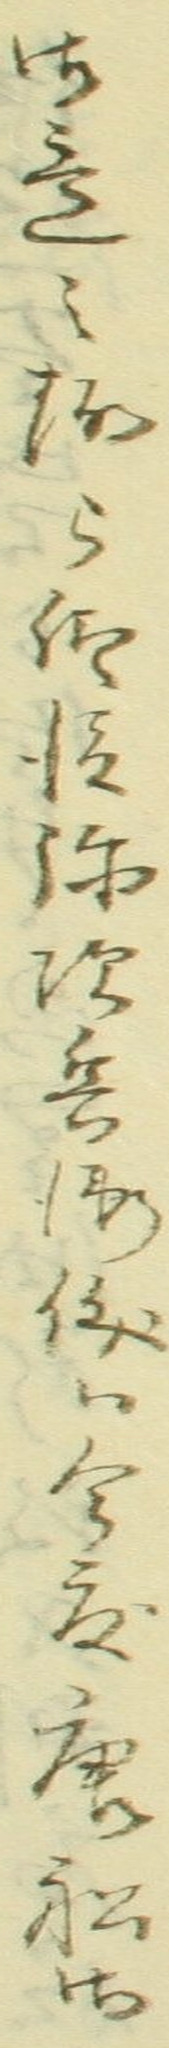御意之様被仰後弥次兵衛儀は今度唐船御

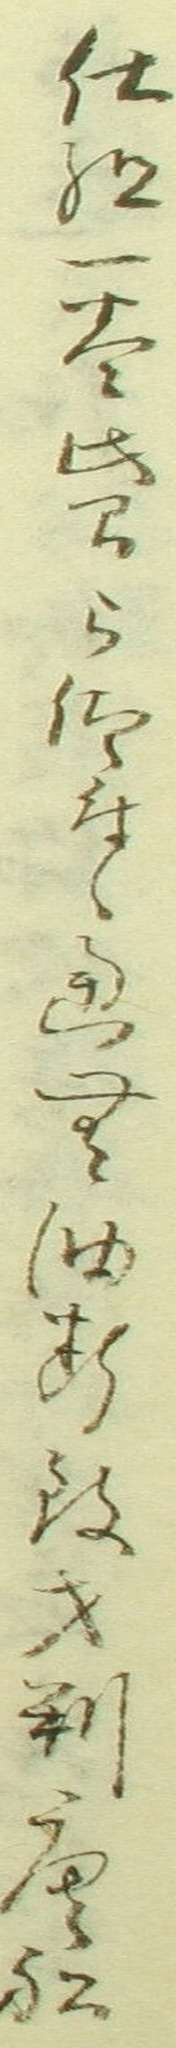仕組一？氏間被仰付候通無油断致才判唐船
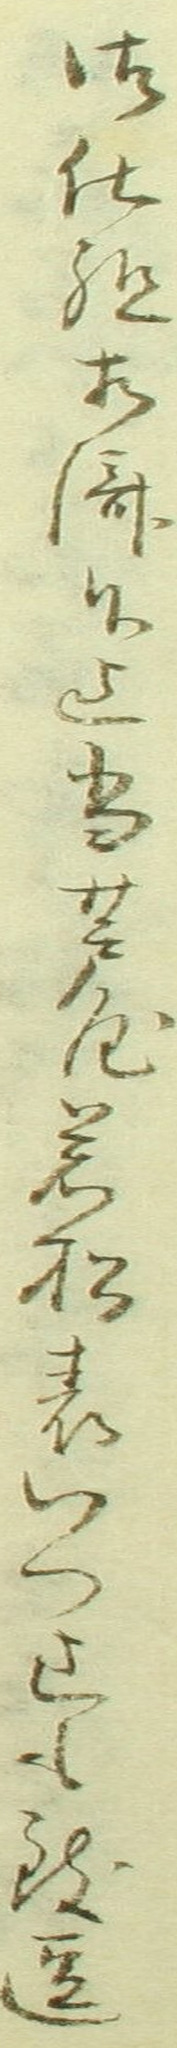御仕組あ相済候迠当芦屋若松表いつれも致逗
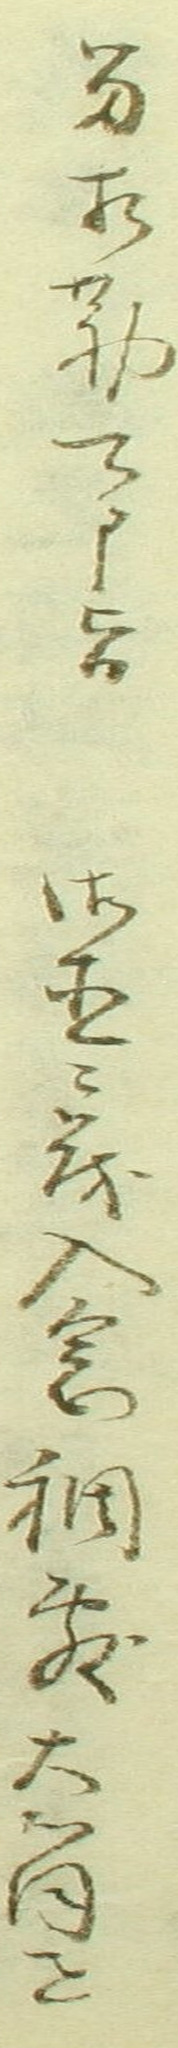留相勤可申旨御直にも入念稠敷大筒を
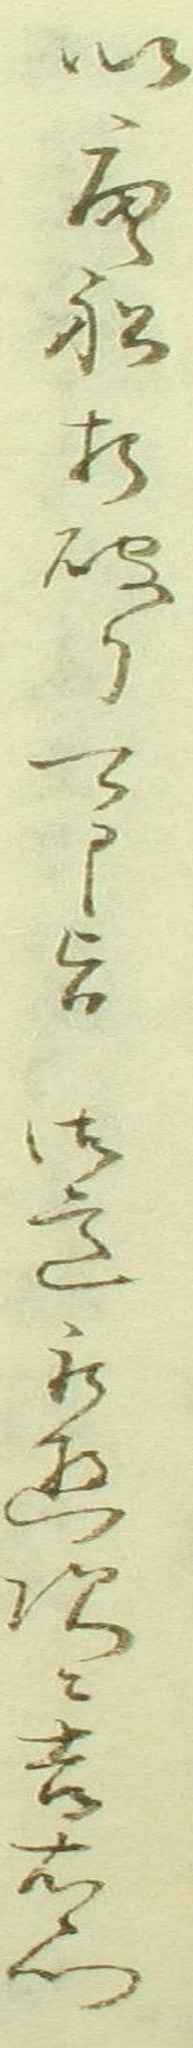以唐船打破り可申旨御適被逝次に吉右衛門
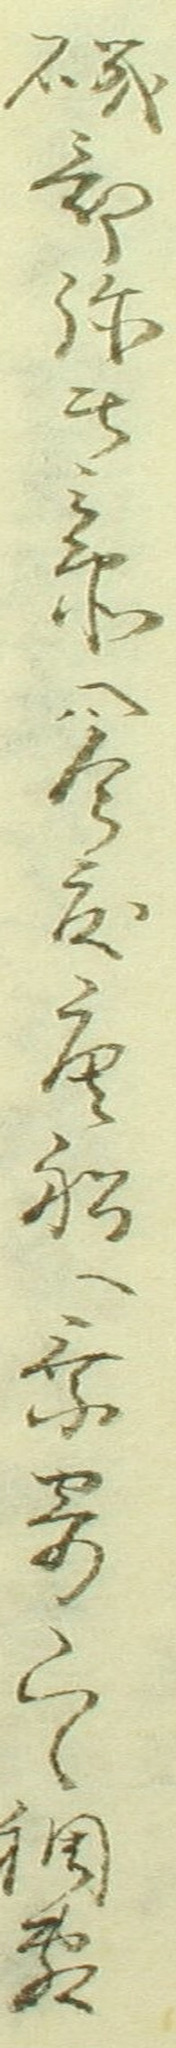磯部弥次兵衛へは今度唐船へ乗寄候はは稠敷
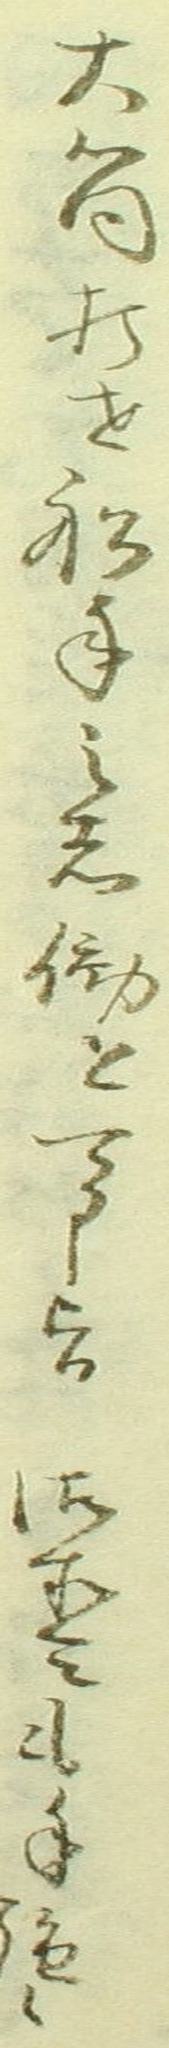大筒打せ船手之者働と可申旨御直にも手強く
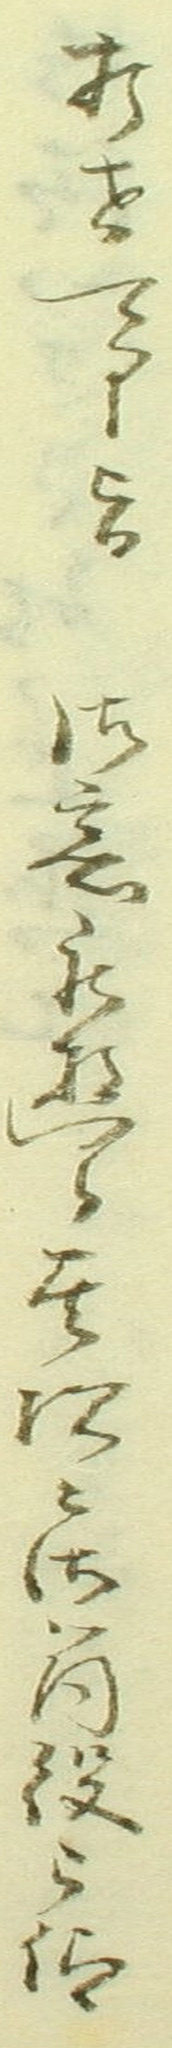打せ可申旨御意被打つ候其次に御筒役被仰
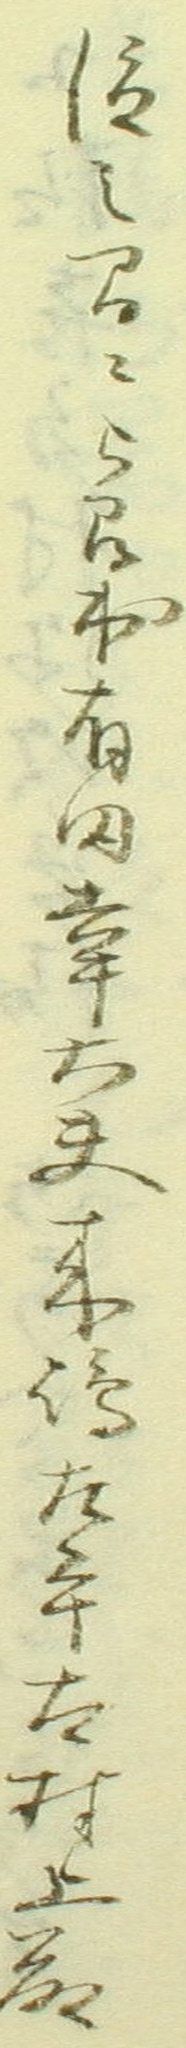後之間に被尋書有田幸太夫来嶋左平太村上籐
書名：唐船漂流記 四
